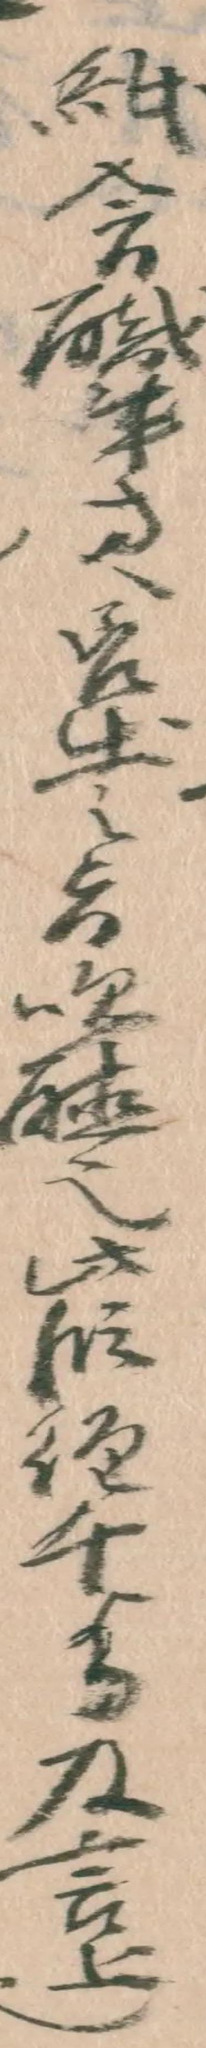紙今日職事方へ差出之旨吹聴也此段経千より言上也
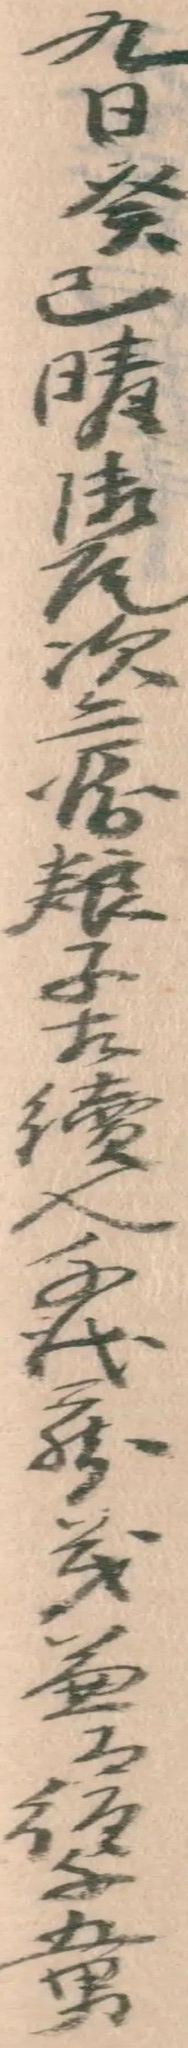九日癸巳晴瀬尾次兵衛養子相續人千代蔵義兼而経千五男
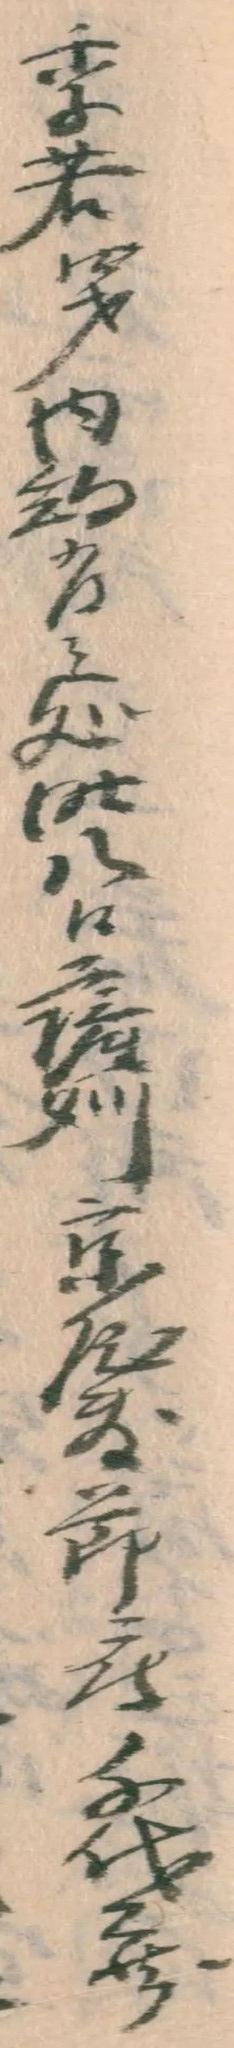季若四才内約有之処昨八日薩州京屋敷節ニ付千代蔵
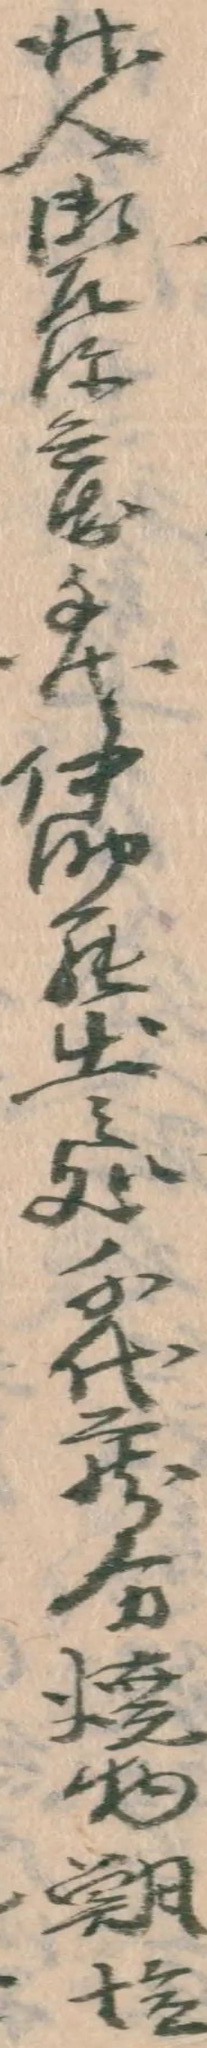代人瀬尾添兵衛手代伊助罷出之処千代蔵分焼物鯛塩
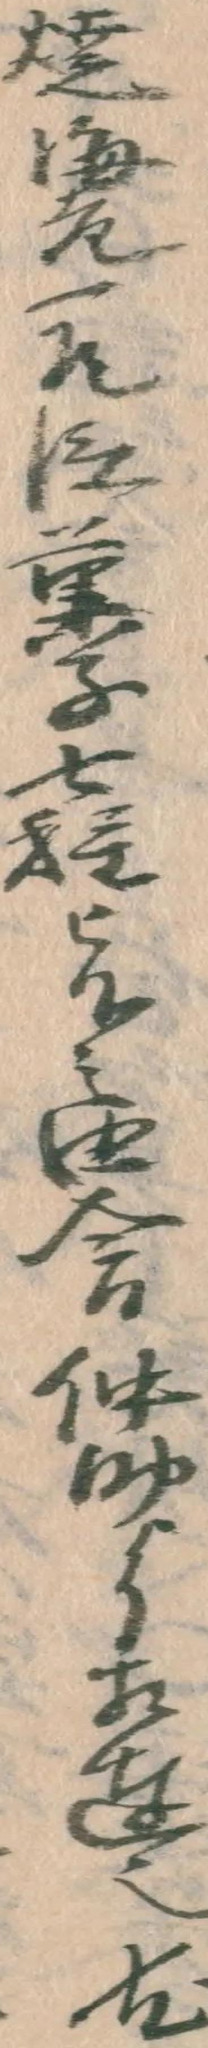焼海老一尾添菓子七種被下之由今日仲助より相達也尤
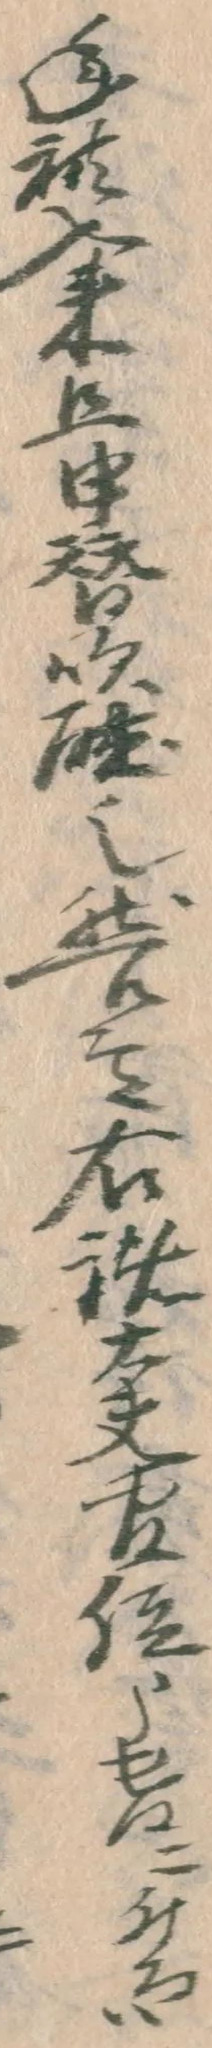年礼入来且申替吹聴也然ル處右諸大夫官位申考ニ付而ハ
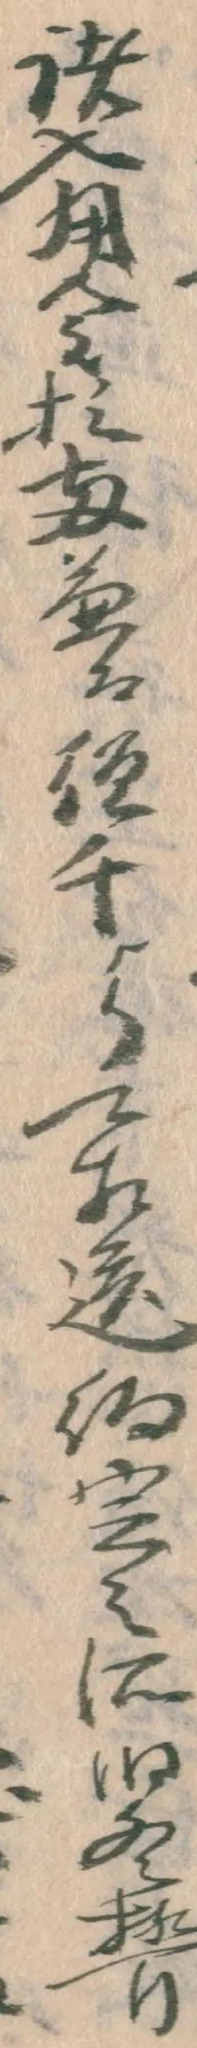諸入用金拾両兼而経千より可相送約定之所旧冬極り
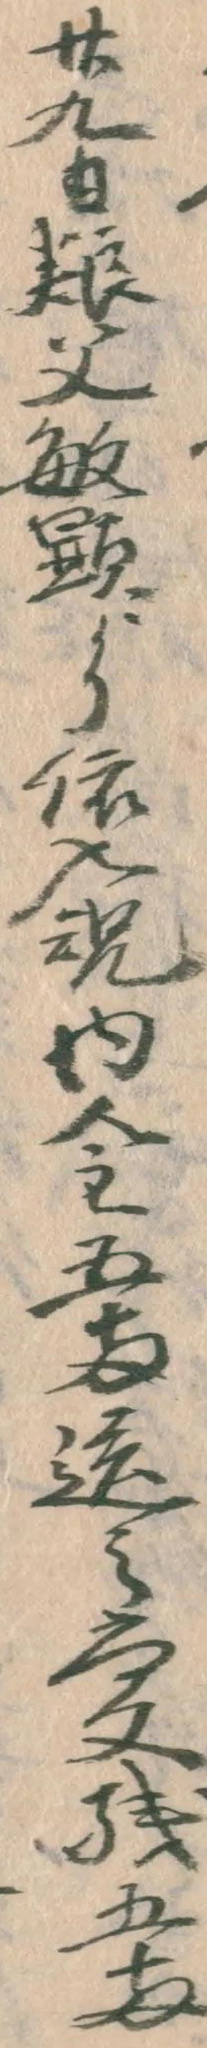廿九日養父敏顕より依入魂内金五両送之尚又残五両
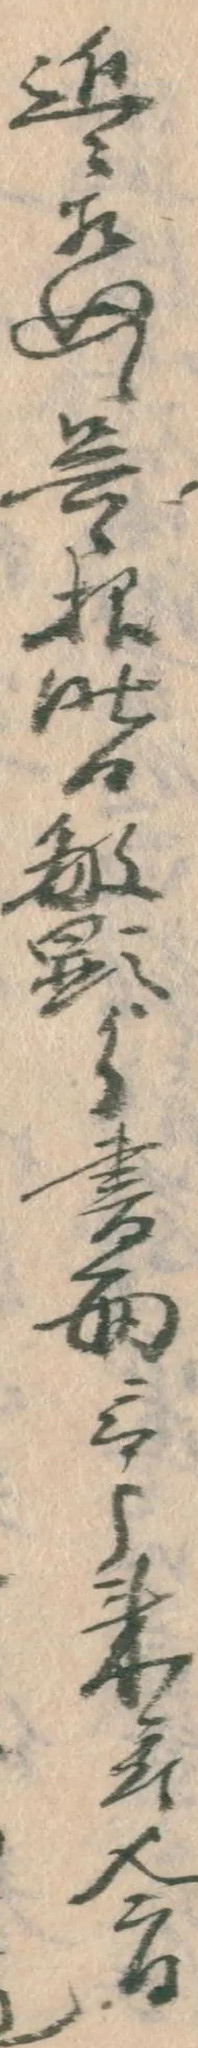近々相廻し呉候様昨日敏顕より書面ニ而申来ニ付今日
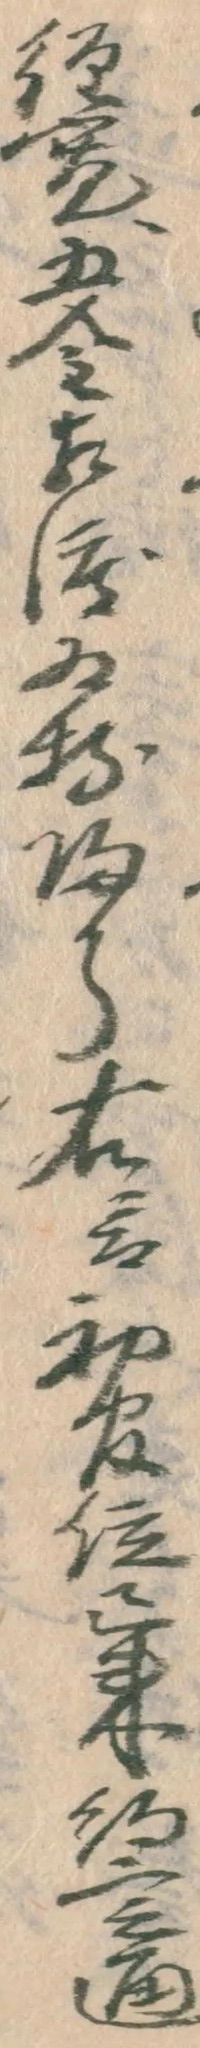経寛ヘ五金相渡為持帰了右二而初官位已来約定通
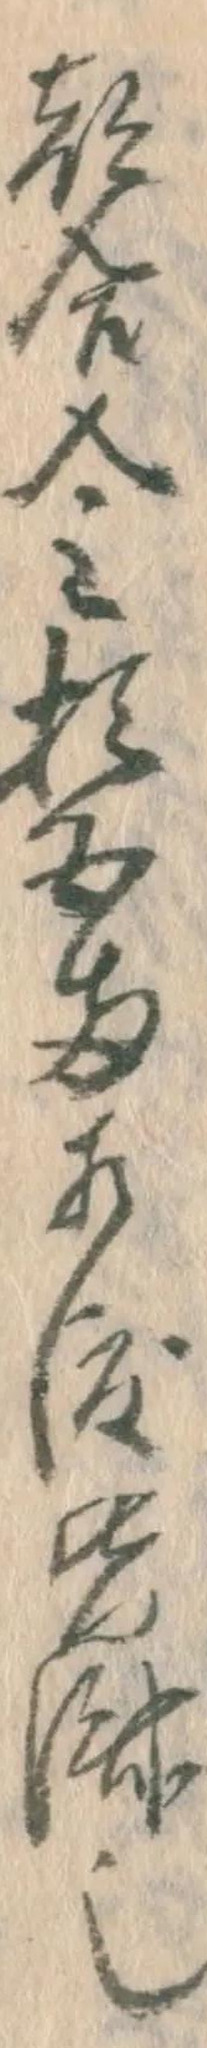都合金拾五両相渡先済也
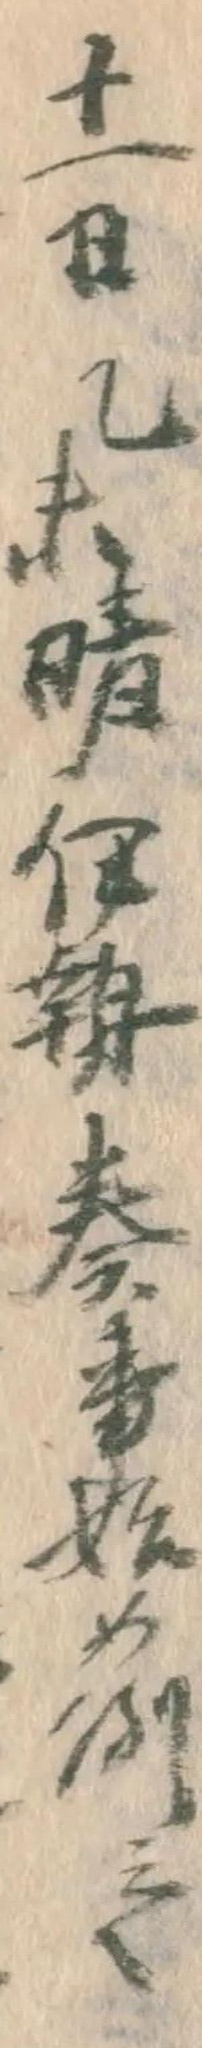十一日乙未晴伊勢奏事始如例云々
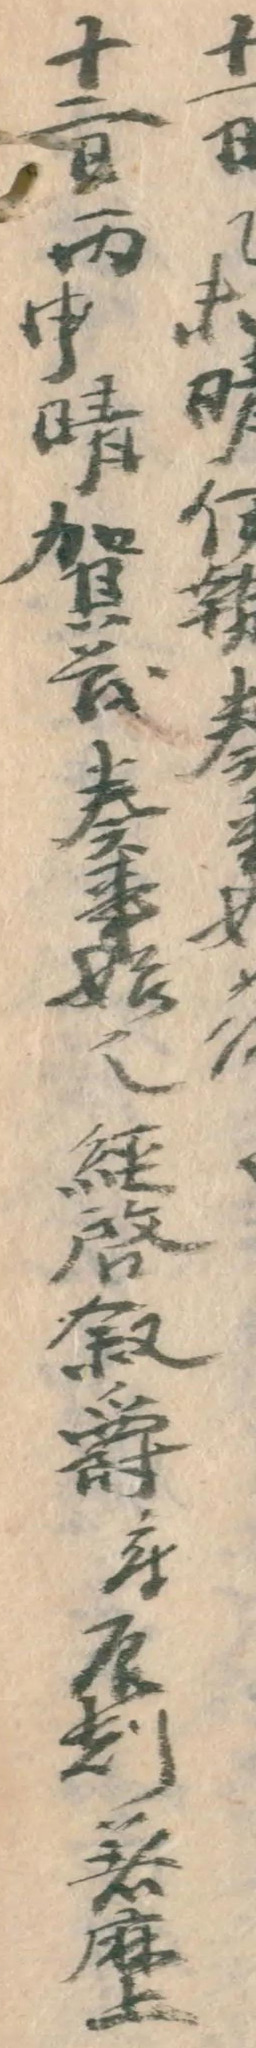十二日丙申晴賀茂奏事始也経啓叙爵ニ付辰刻着上

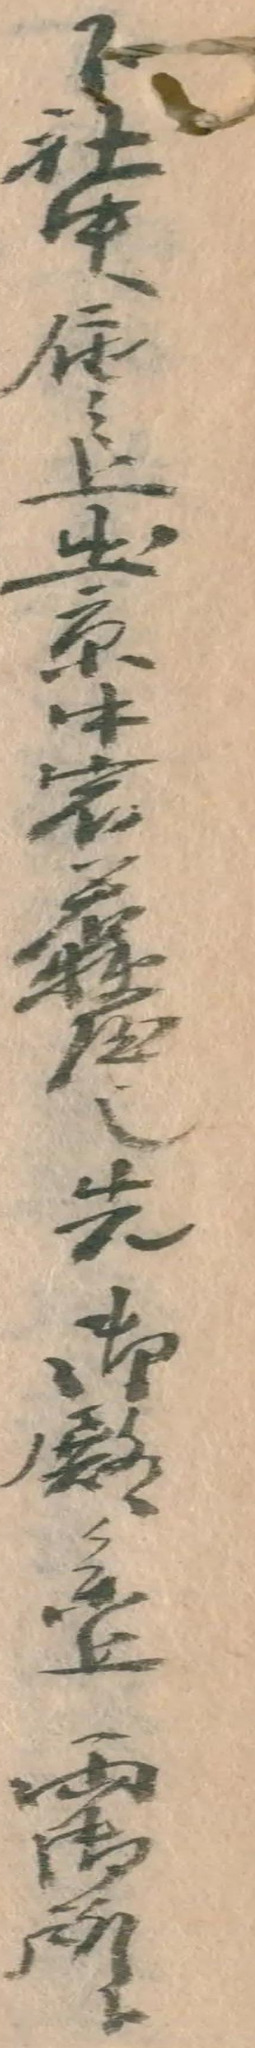下社中へ届之上出京中宿若狭屋之先御殿へ参両御所え
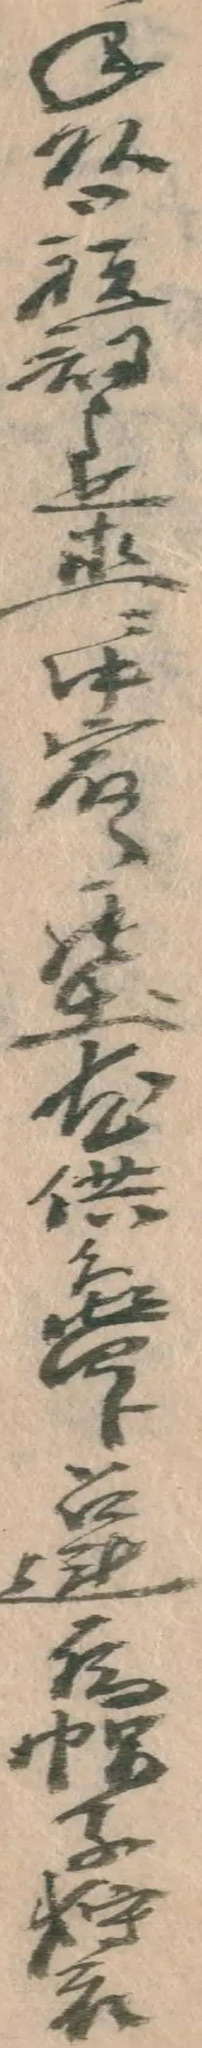年頭御祝詞申上直二中宿へ罷出尤供亀四郎召連烏帽子狩衣
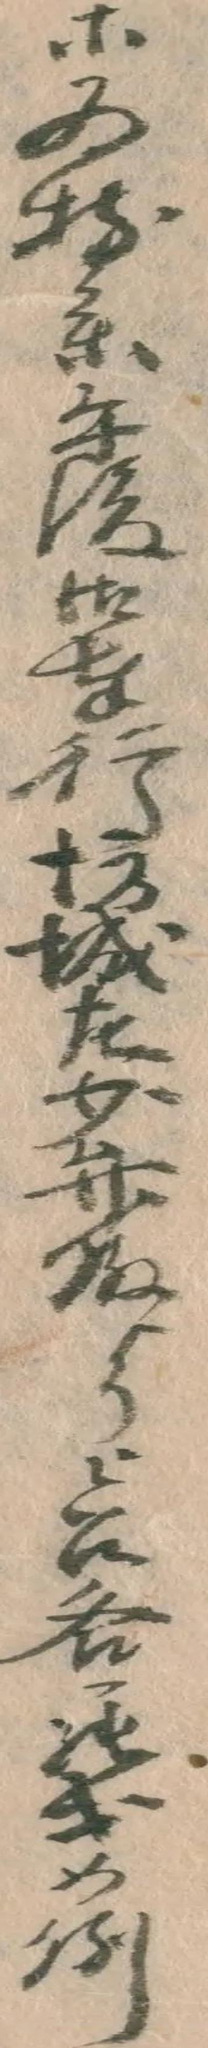等為持参午後御奉行坊城左少弁殿より被召各罷出如例
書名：賀茂社記録. 第67冊
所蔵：国立国会図書館 National Diet Library, JAPAN
